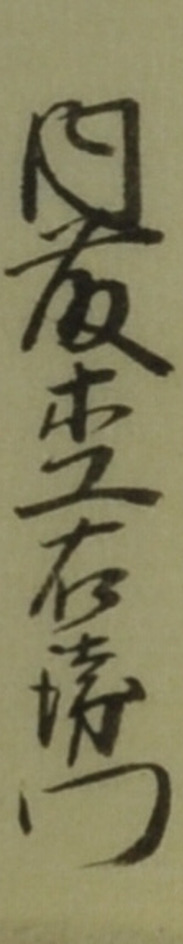内藤杢右衛門
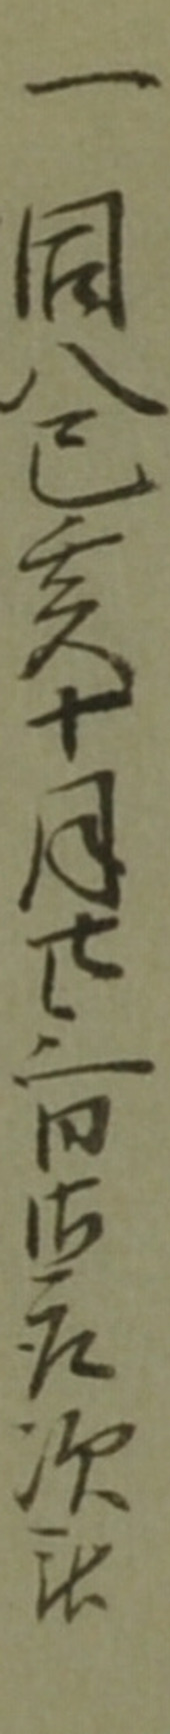一同八己亥十月廿三日御取次被
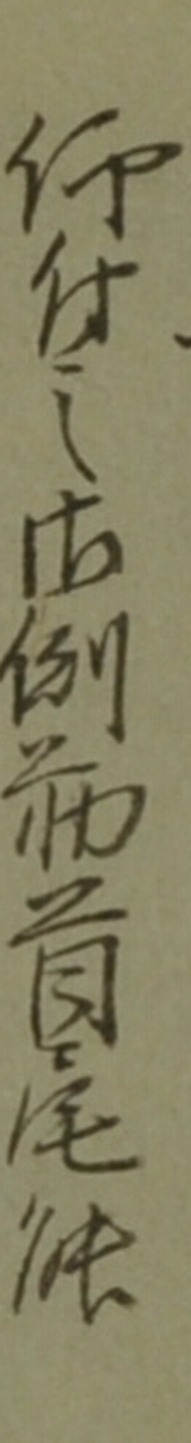仰付之御側勤首尾能
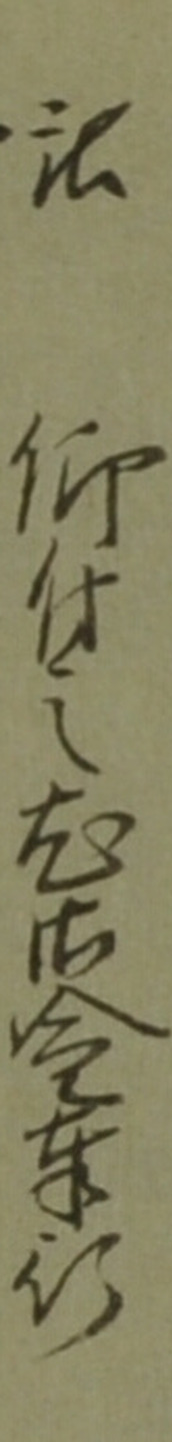被仰付之尤御金奉行
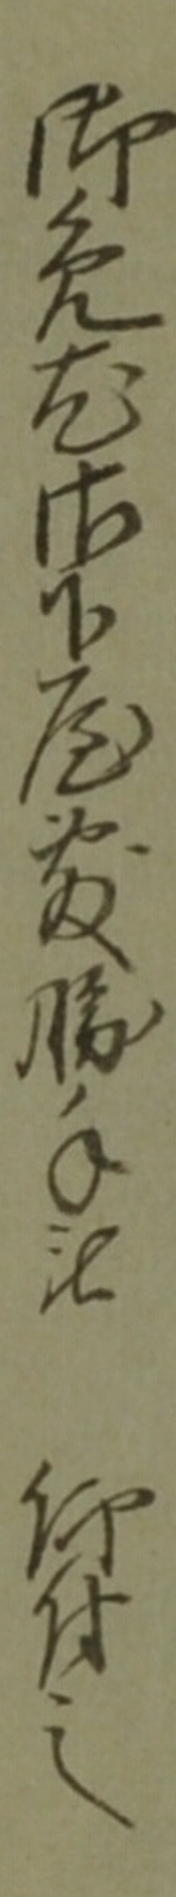御免尤御下屋敷勝手被仰付之
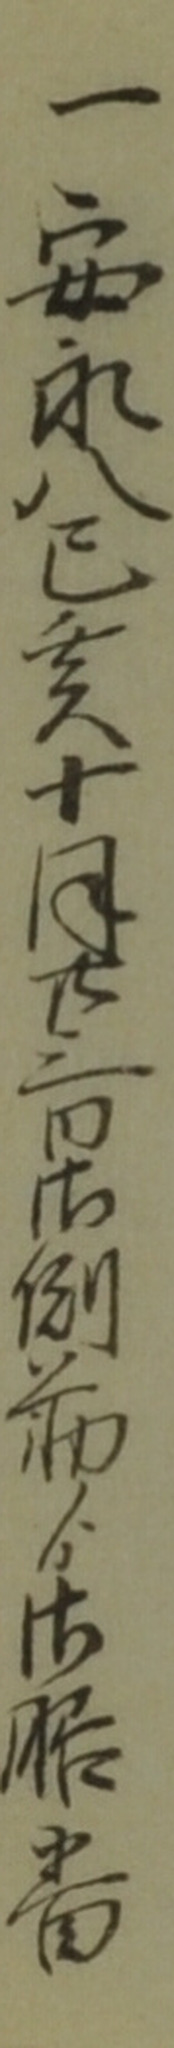一安永八己亥十月廿三日御側勤ゟ御膳番
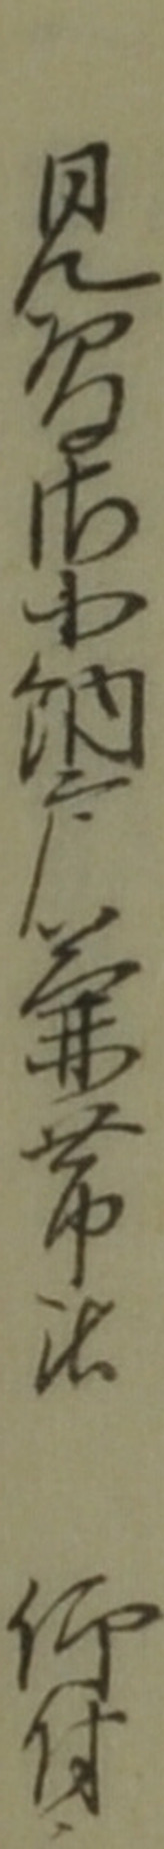見習御小納戸兼帯被仰付之
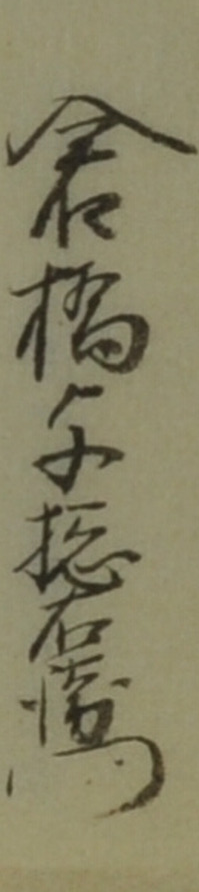倉橋与捴右衛門
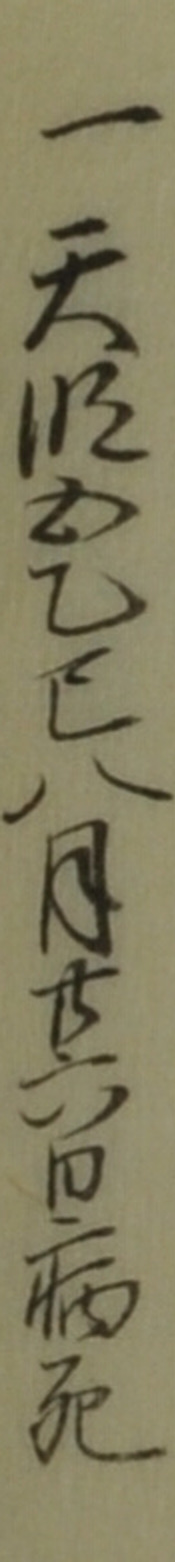一天明五乙巳八月廿六日病死
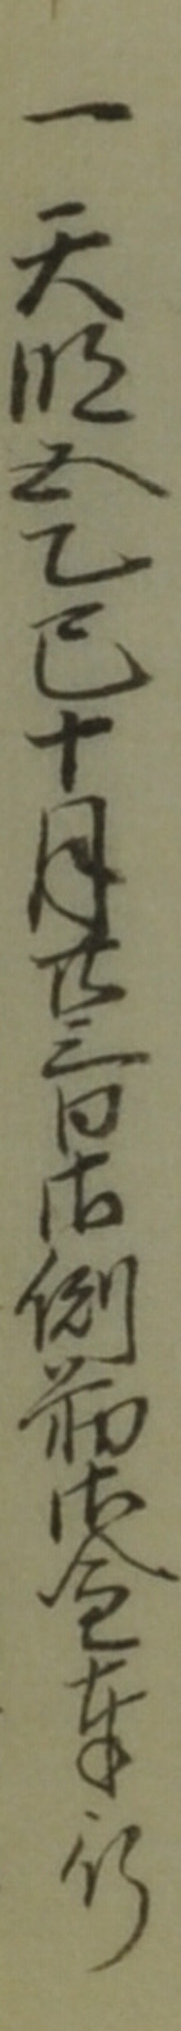一天明乙巳十月廿三日御側勤御金奉行
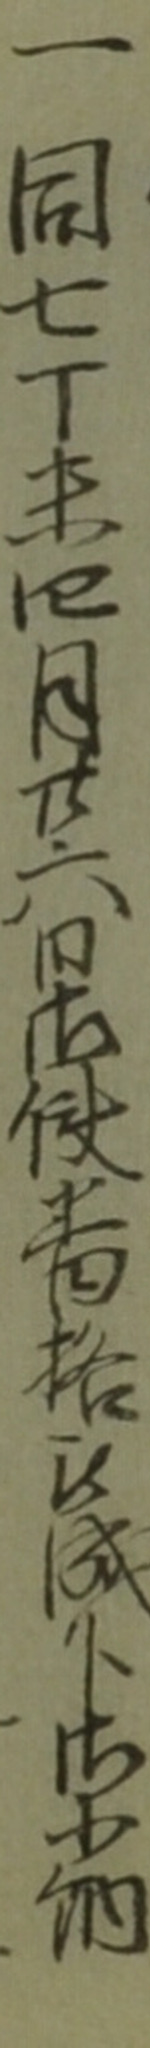一同七丁未四月廿六日御使番格被成下御小納
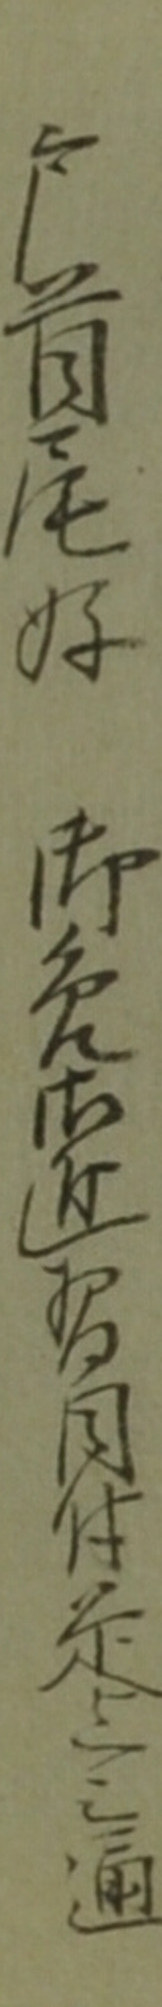戸首尾好御免御近習目付是迄之通
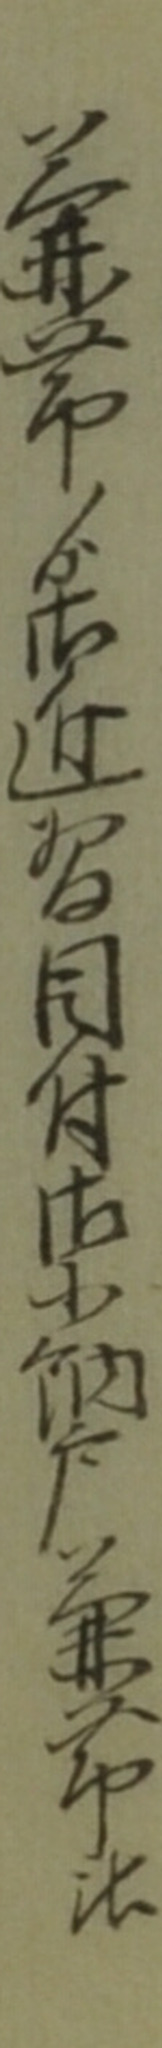兼帯ゟ御近習目付御小納戸兼帯被
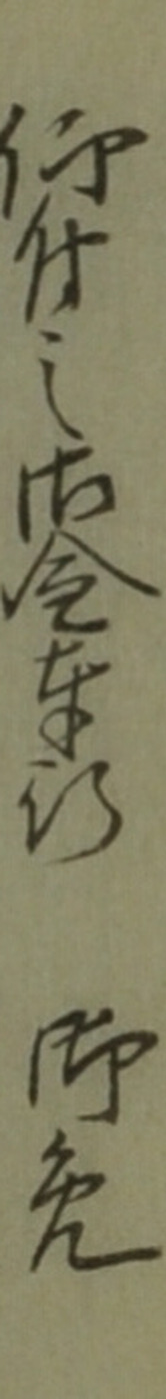仰付之御金奉行御免
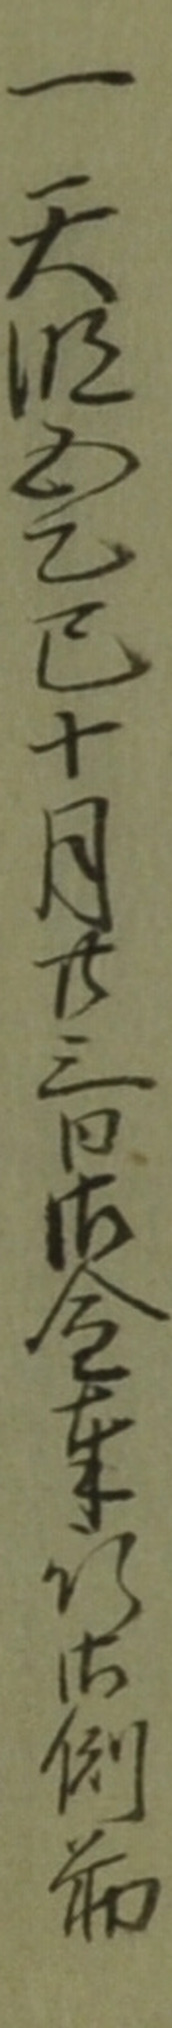一天明五乙巳十月廿三日御金奉行御側勤
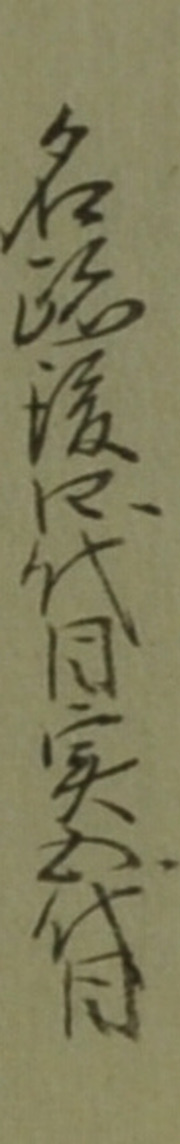名跡後四代目実五代目
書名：諸御役代々録（四）
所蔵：伊那市立高遠町図書館・合同会社AMANE
